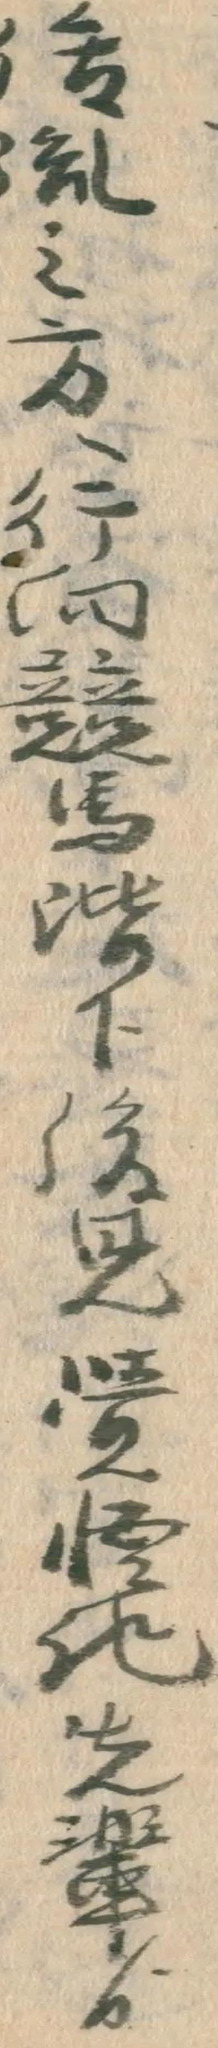後胤之方へ行向、競馬階下後見覚悟他、先輩ゟ
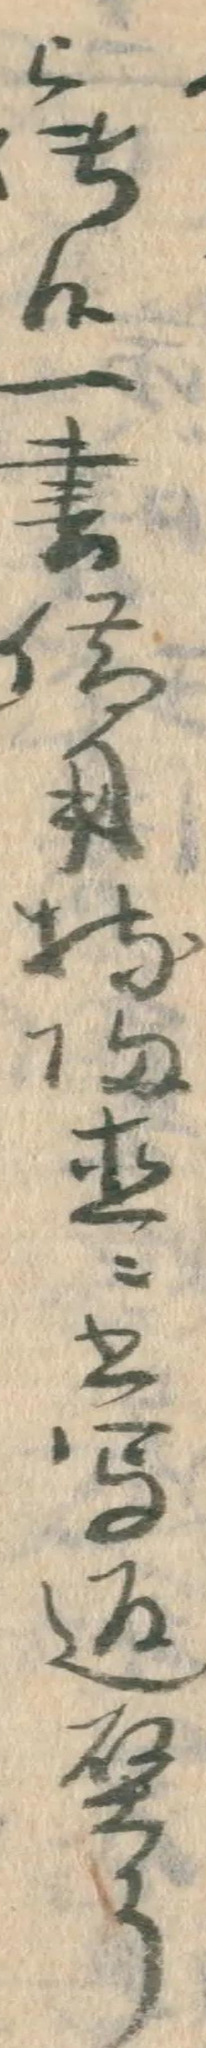被傳候一書借用、持帰直に書写返了、
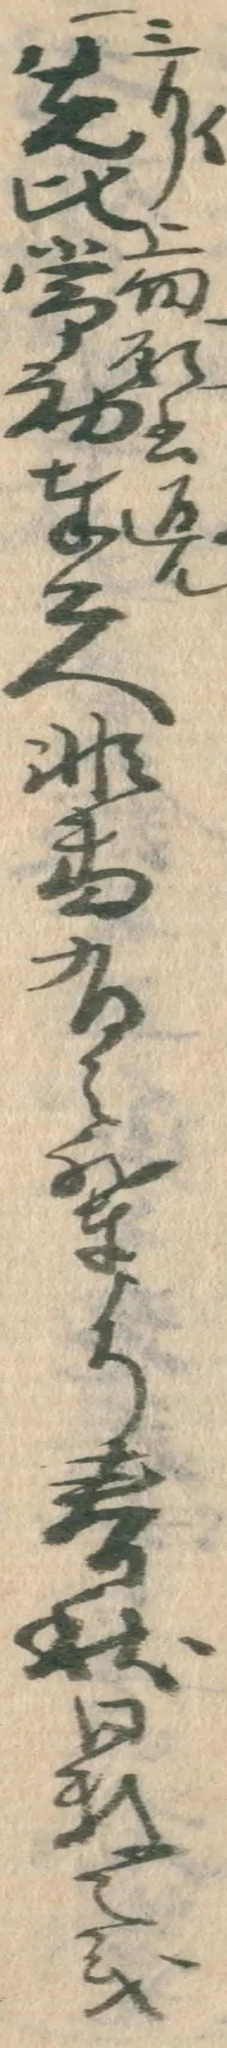先頃、常勤奉公人非番有之輩より、春秋日数之義
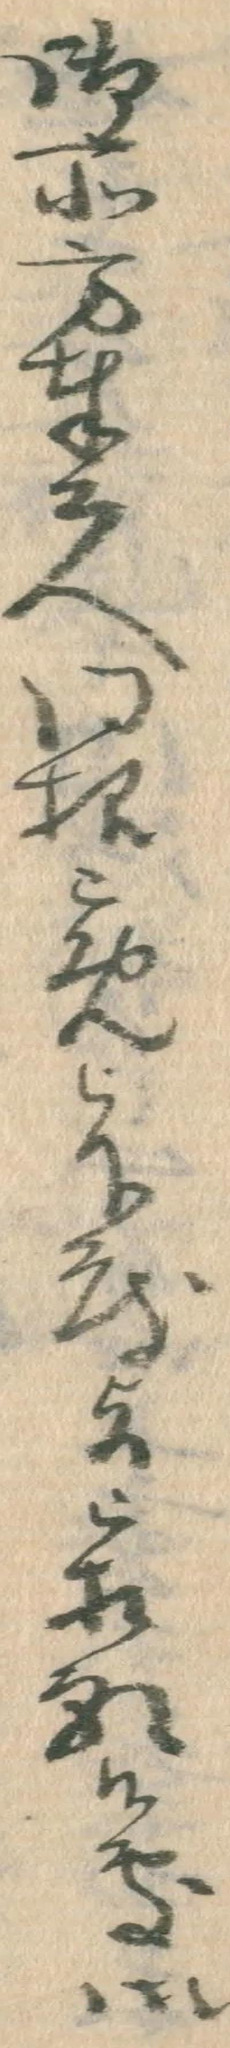御所方奉公人同様被免被下度旨、被相願候處、御
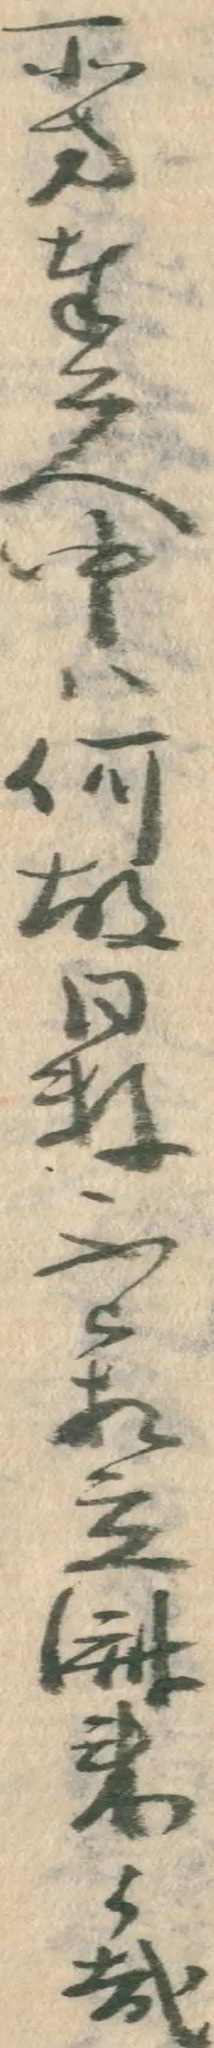所方奉公人中ハ、何故日数不被相立済来候哉、
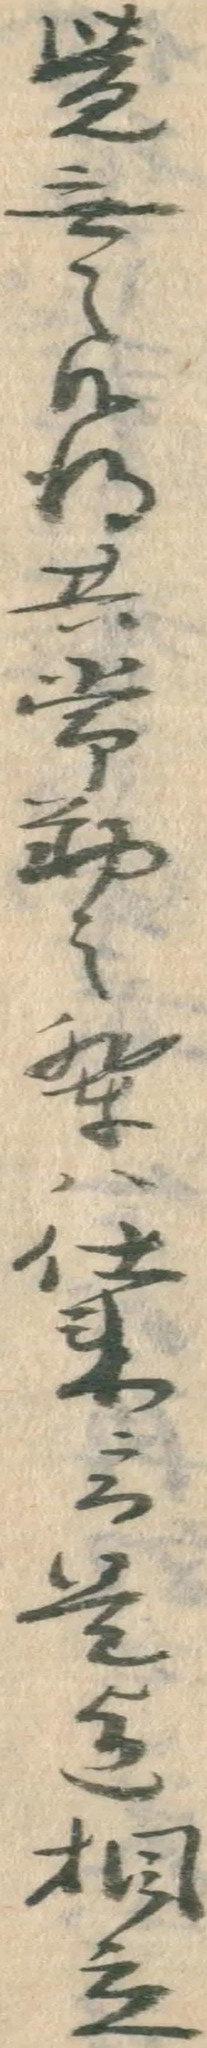覚無之候得共、常勤之輩ハ仕来ニ而是迄相立
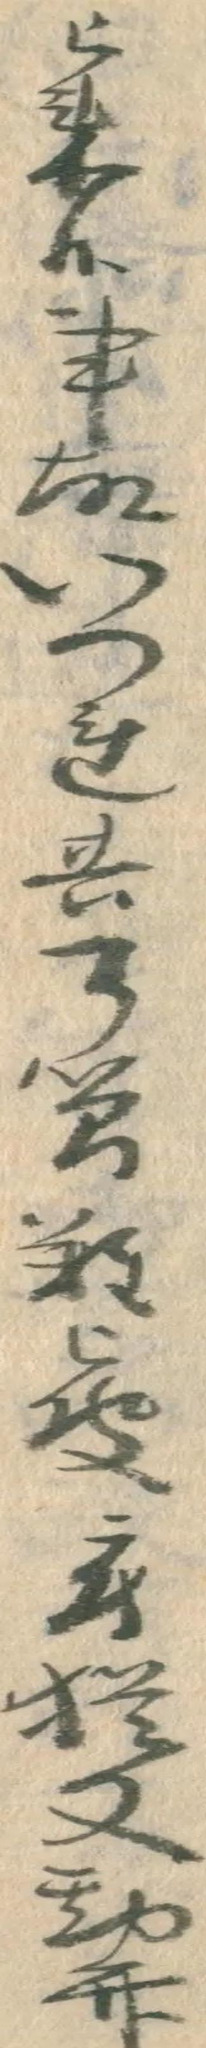被来候事故、いつれ共了簡難被決ニ付、猶又勘弁
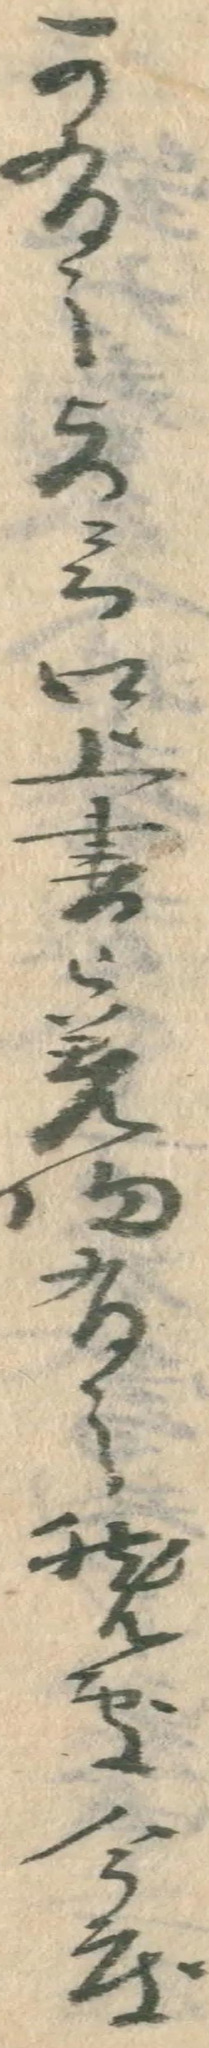可有之旨ニ而口上書被差出有之、然ル處、今度
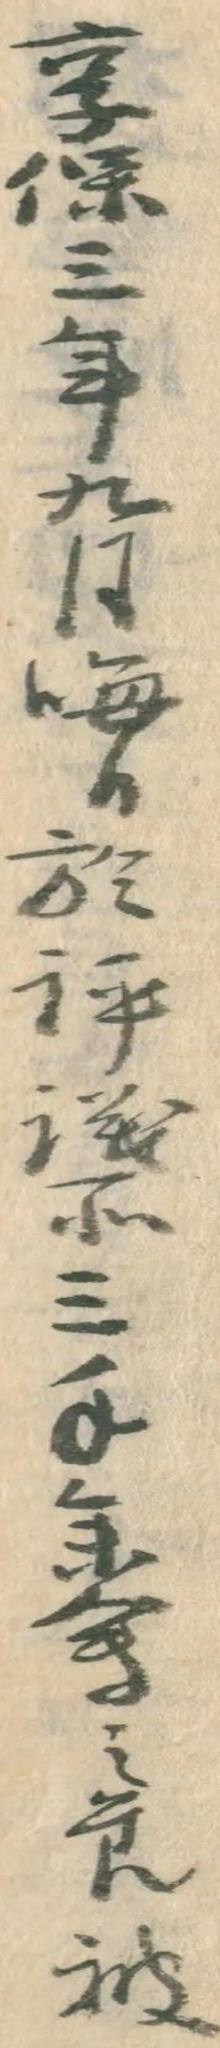享保三年九月晦日於評議所三手参會之節被

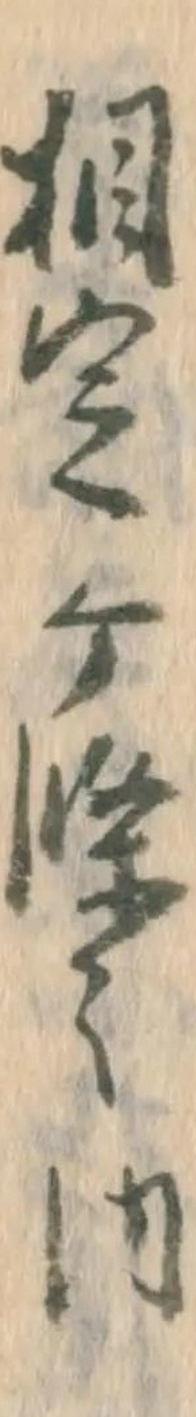相定ヶ條之内
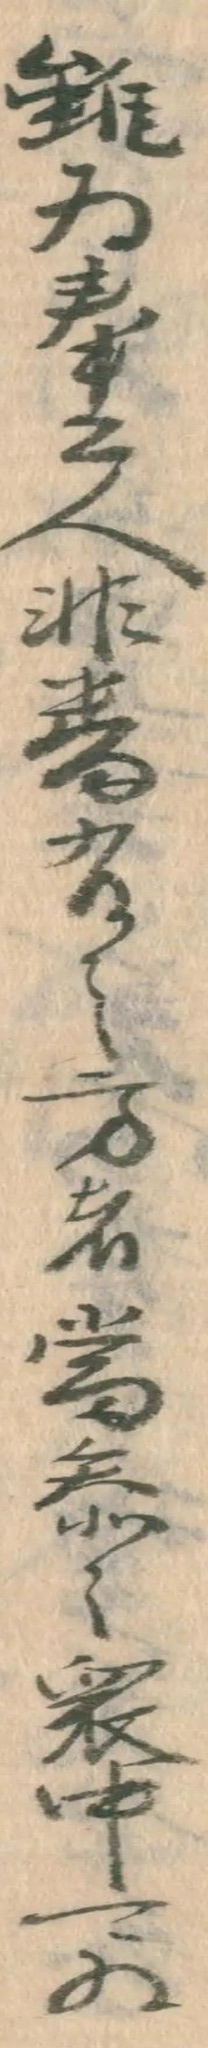雖為奉公人非番有之方者、當参之衆中可為
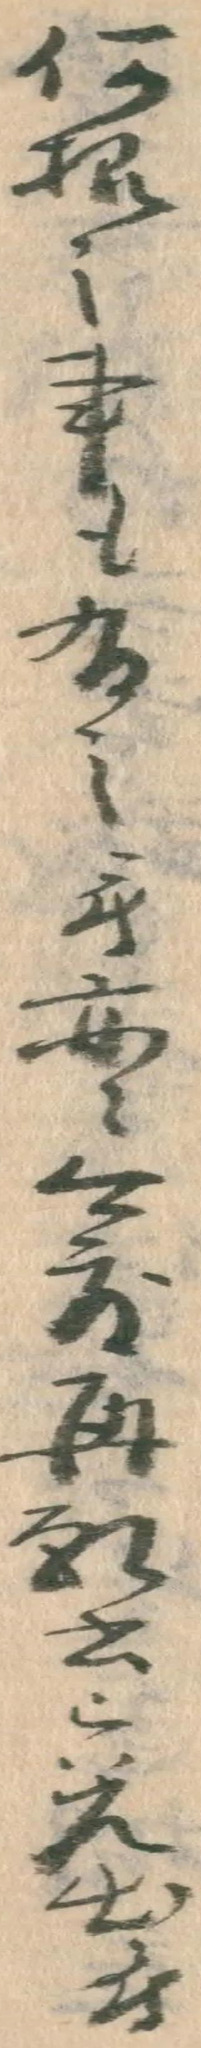何様之事も有之ニ付、亦々今度再願書被差出ニ付、
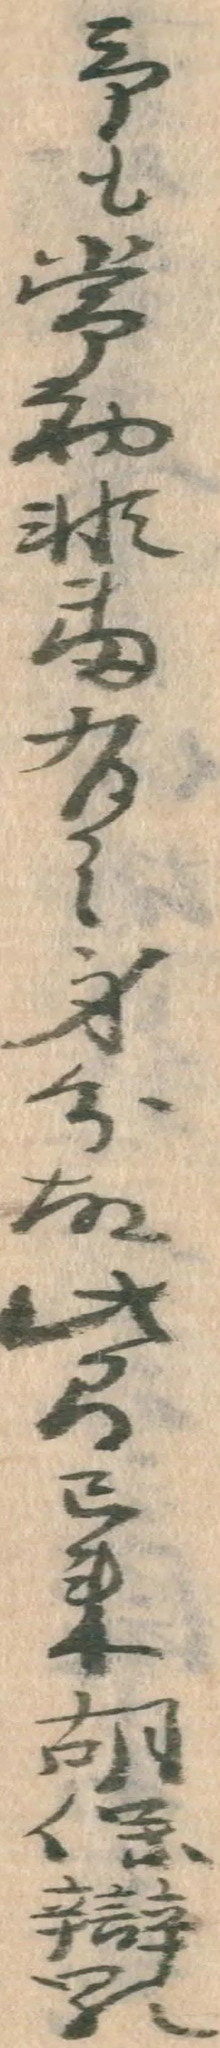予も常勤非番有之身分故、此間已来、胡保・辨顕
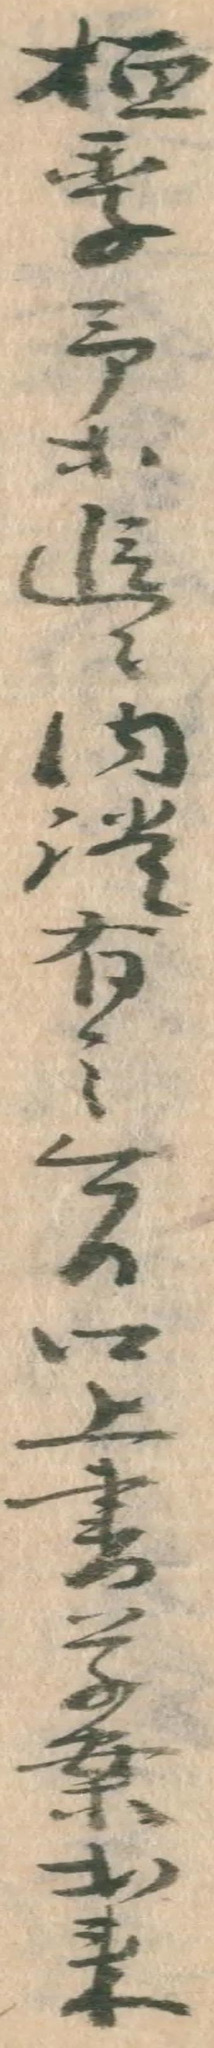桓季・予等追々内談有之、今日口上書草葉出来、
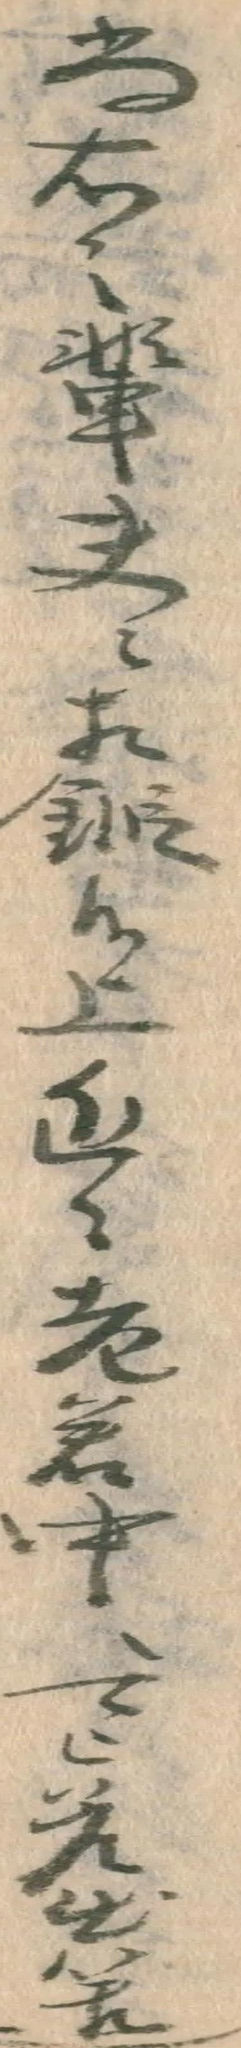尚右之輩夫々相願候上、近々老若中へ可被差出筈也、
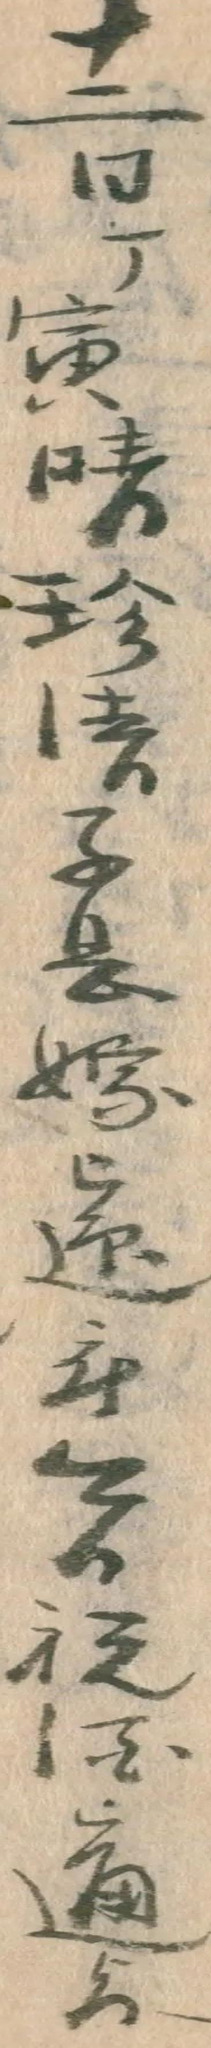十二日丙寅晴、珍清子息嫁被迎ニ付、今日祝酒通旨
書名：賀茂社記録. 第63冊
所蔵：国立国会図書館 National Diet Library, JAPAN
